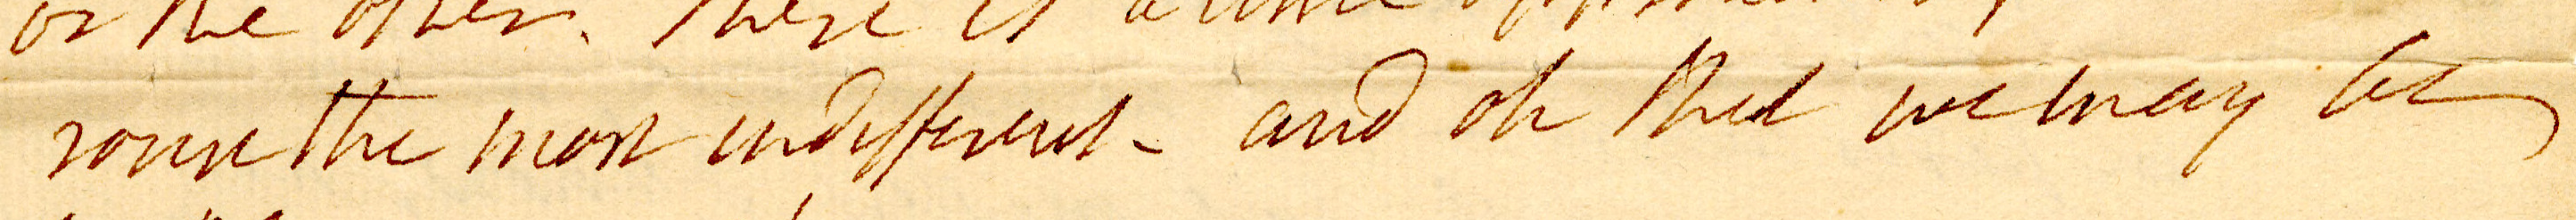rouse the most indifferent. and oh that we may be
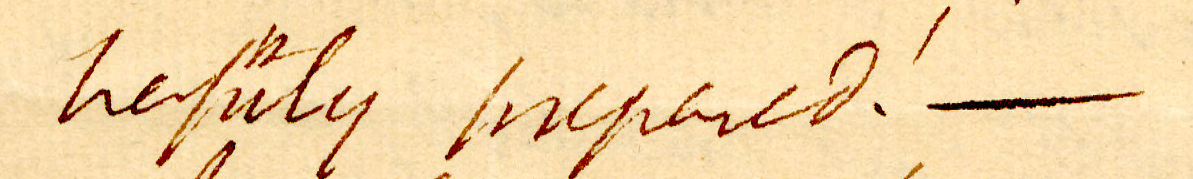hap^pily prepared.-
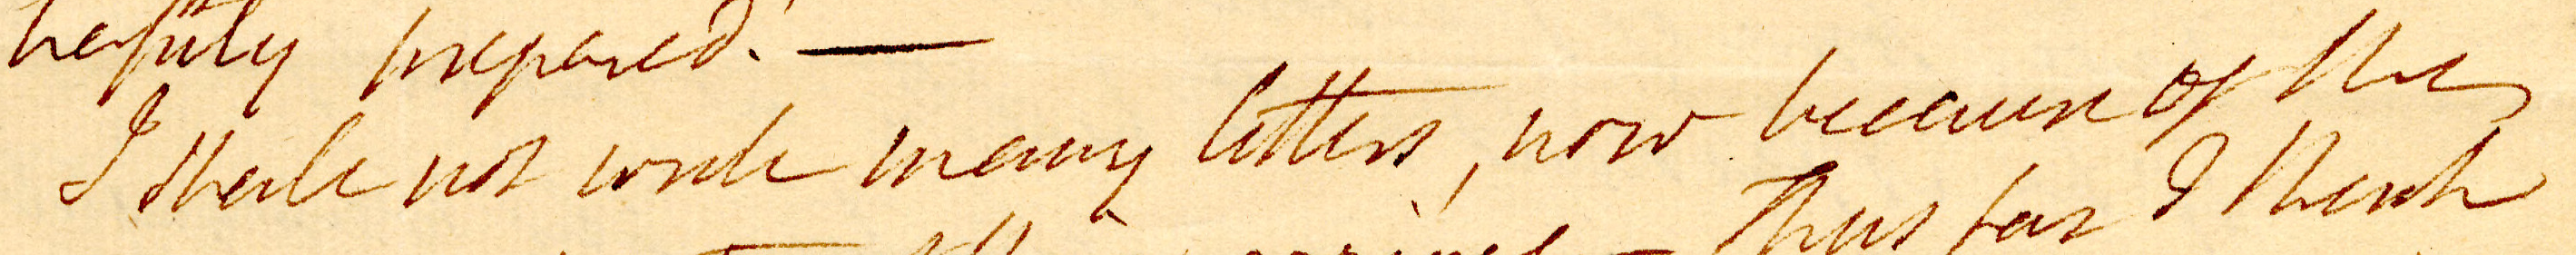I shall not write many letters, now because of the
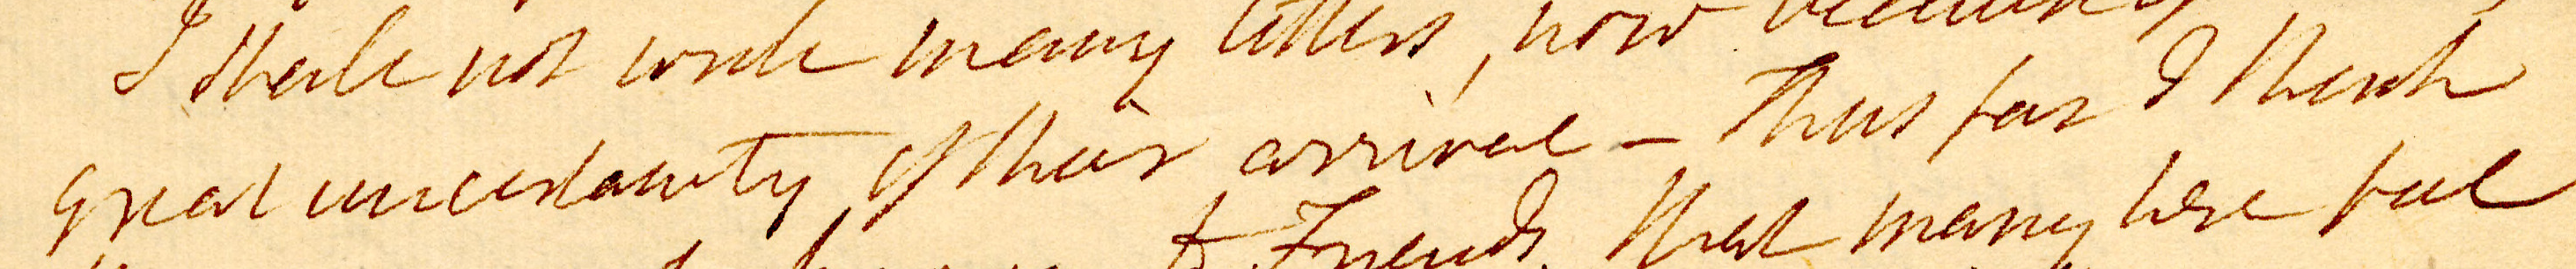great uncertainty of their arrival.- Thus far I think
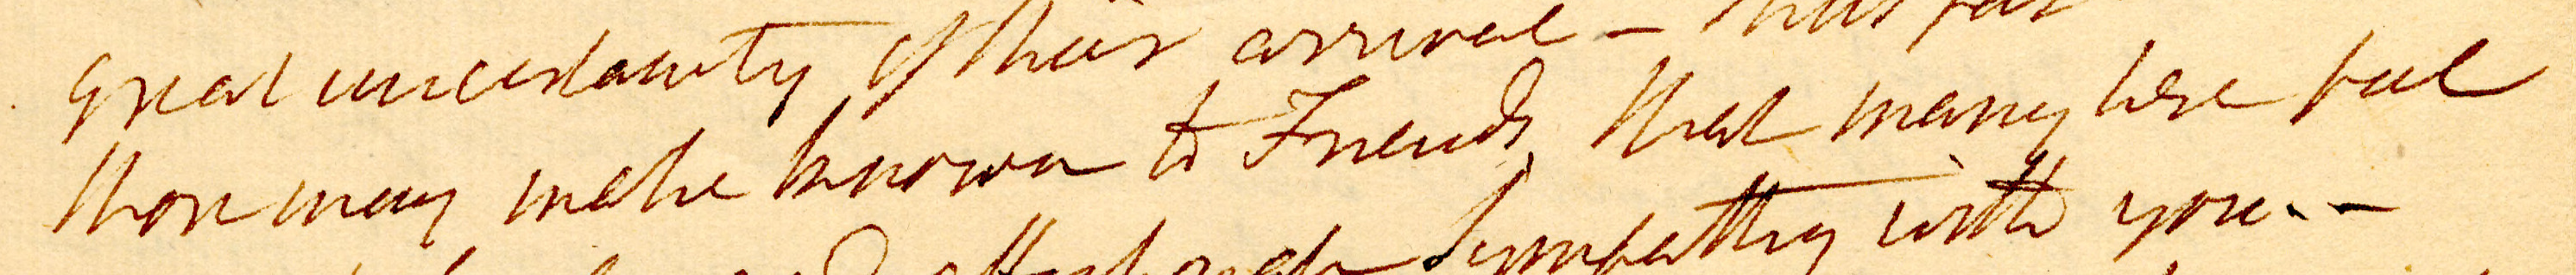thou may make known to Friends that many here feel
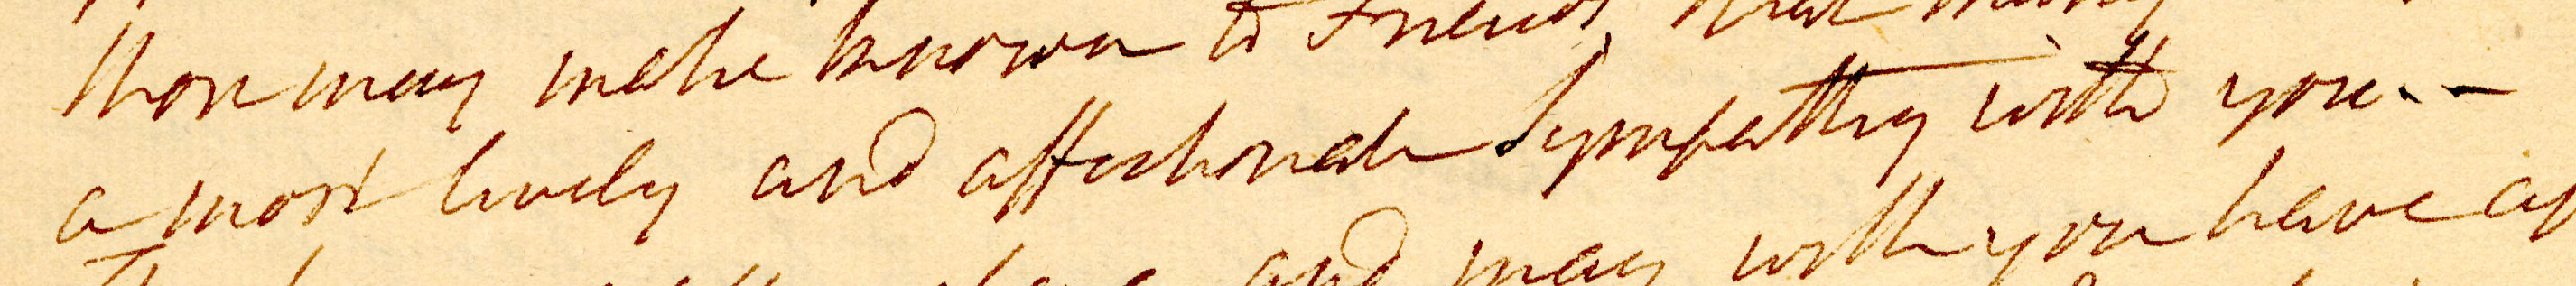a most lively and affectionate Sympathy with you.-
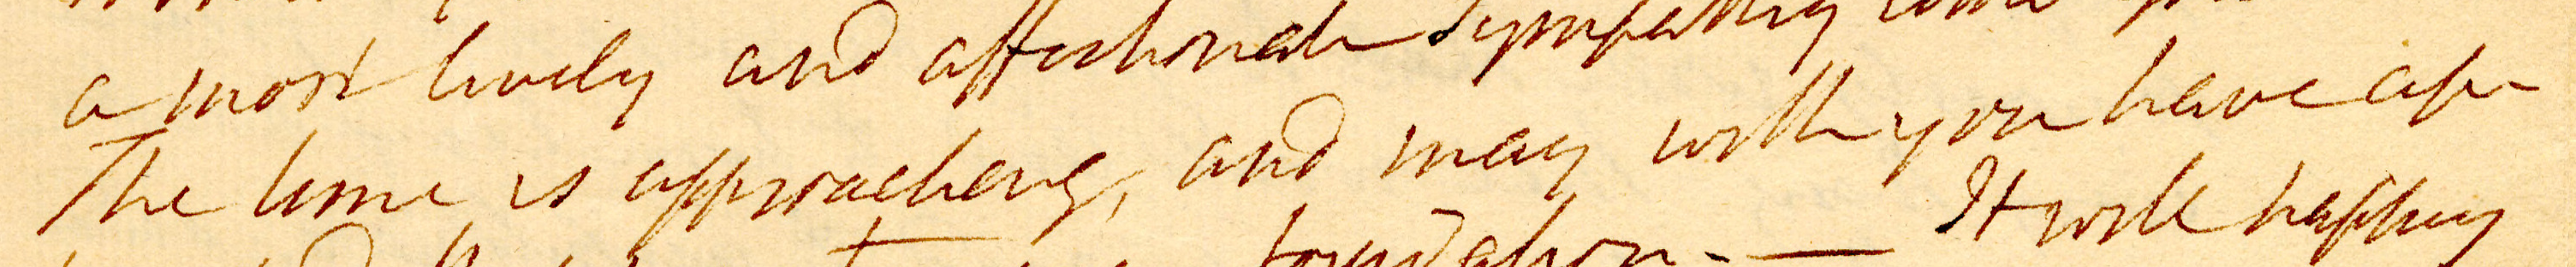The time is approaching, and may with you have ap-
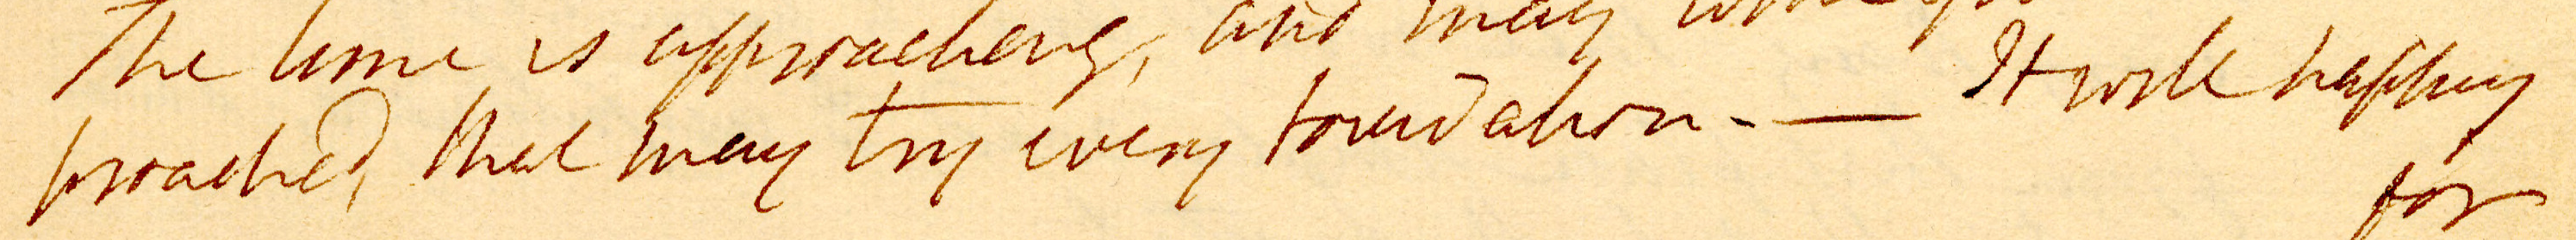proached, that may try every foundation.- It will happen
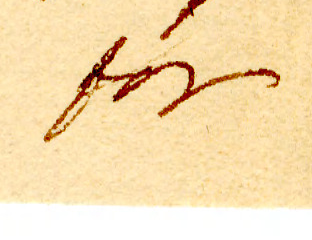for
